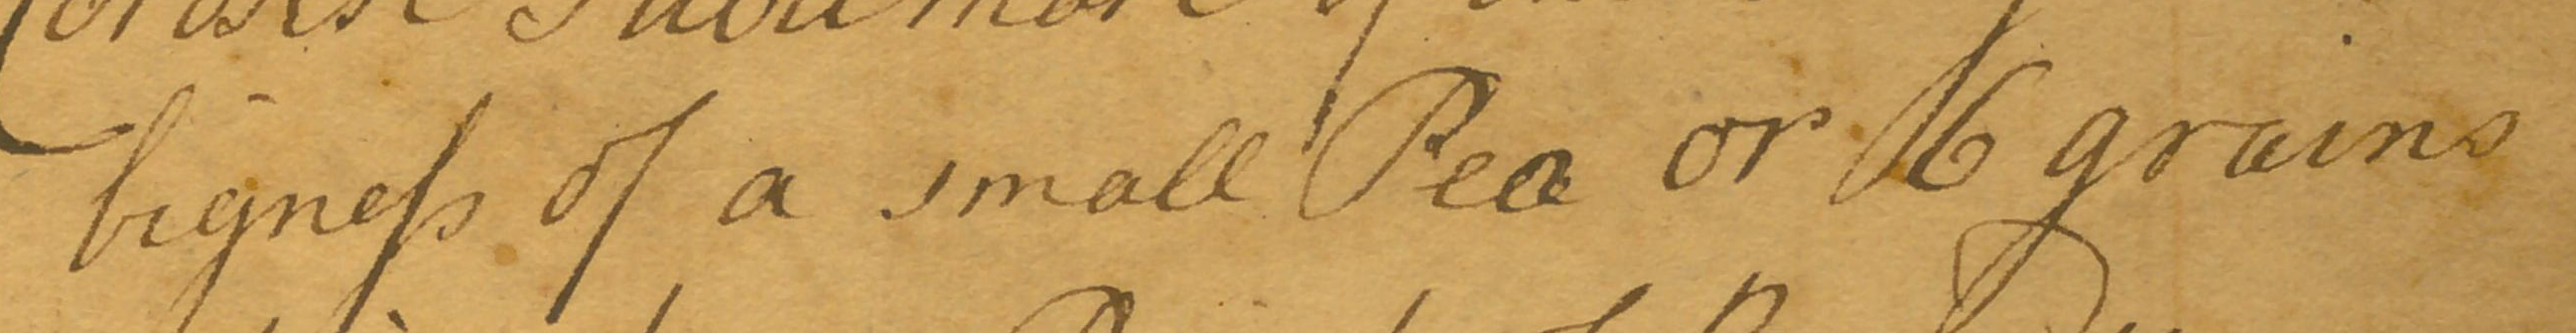bigness of a small Pea or 6 grains
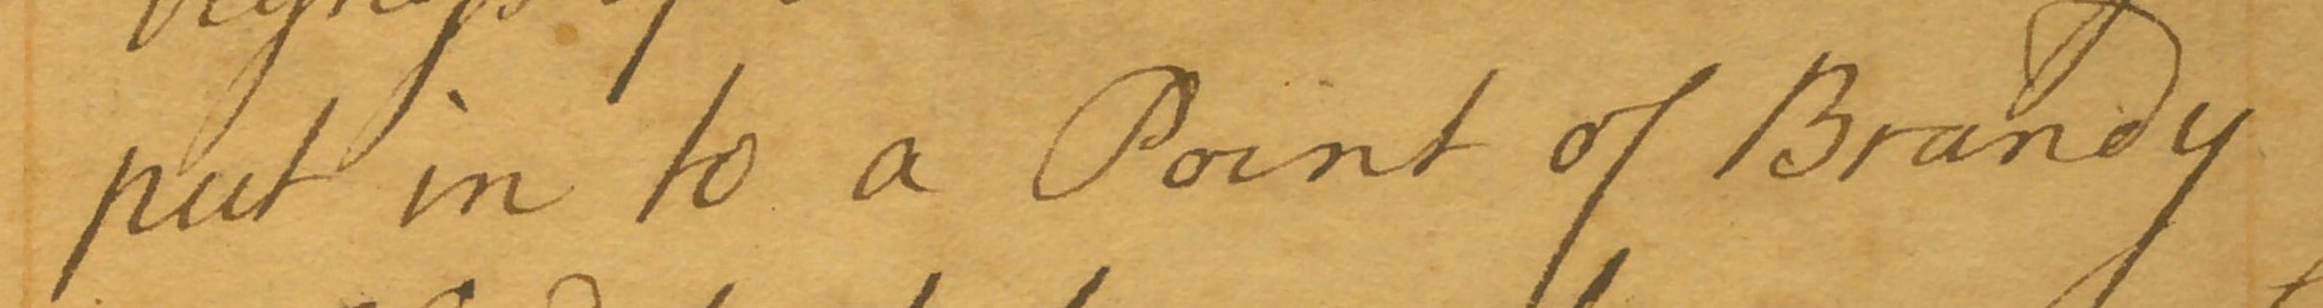put in to a Point of Brandy
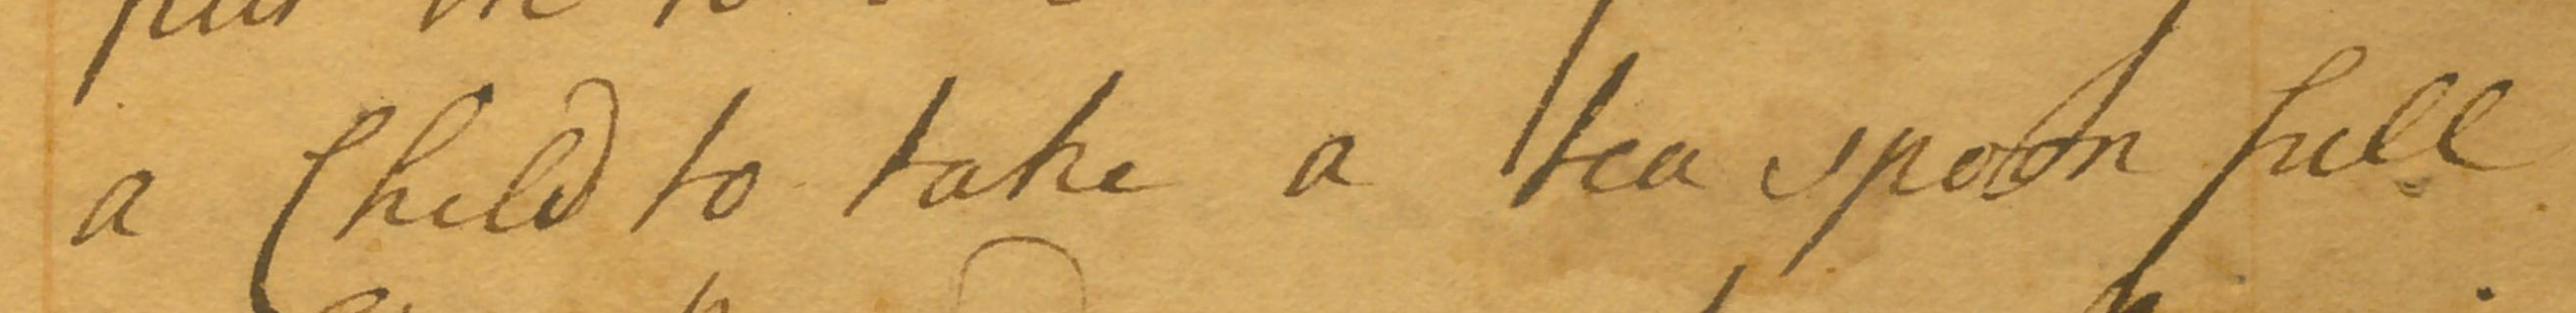a Child to take a tea spoon full
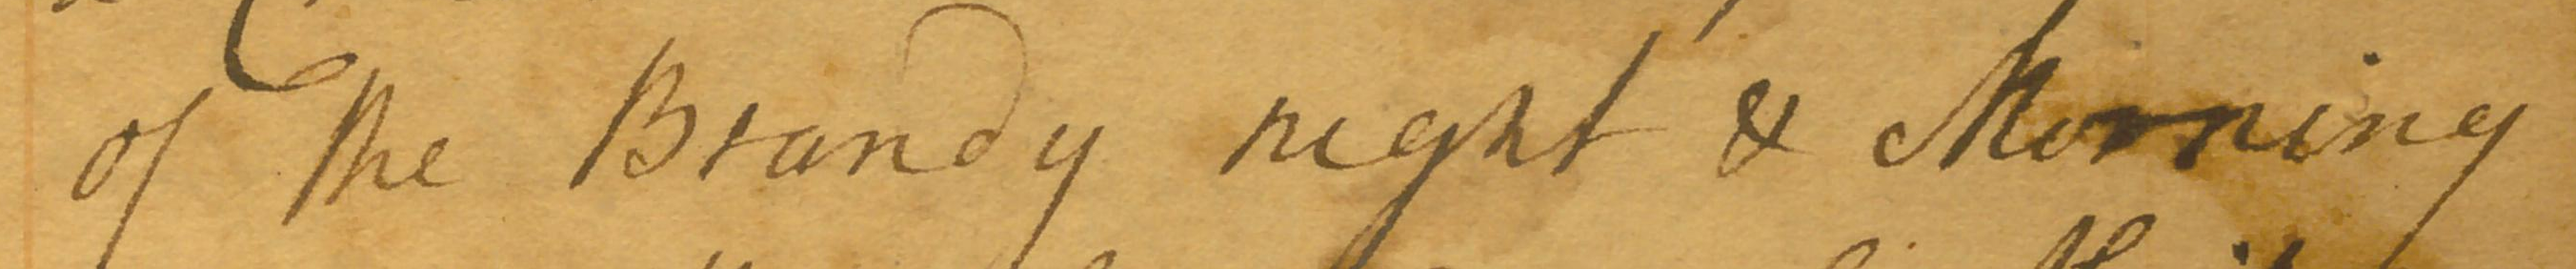of the Brandy night & Morning
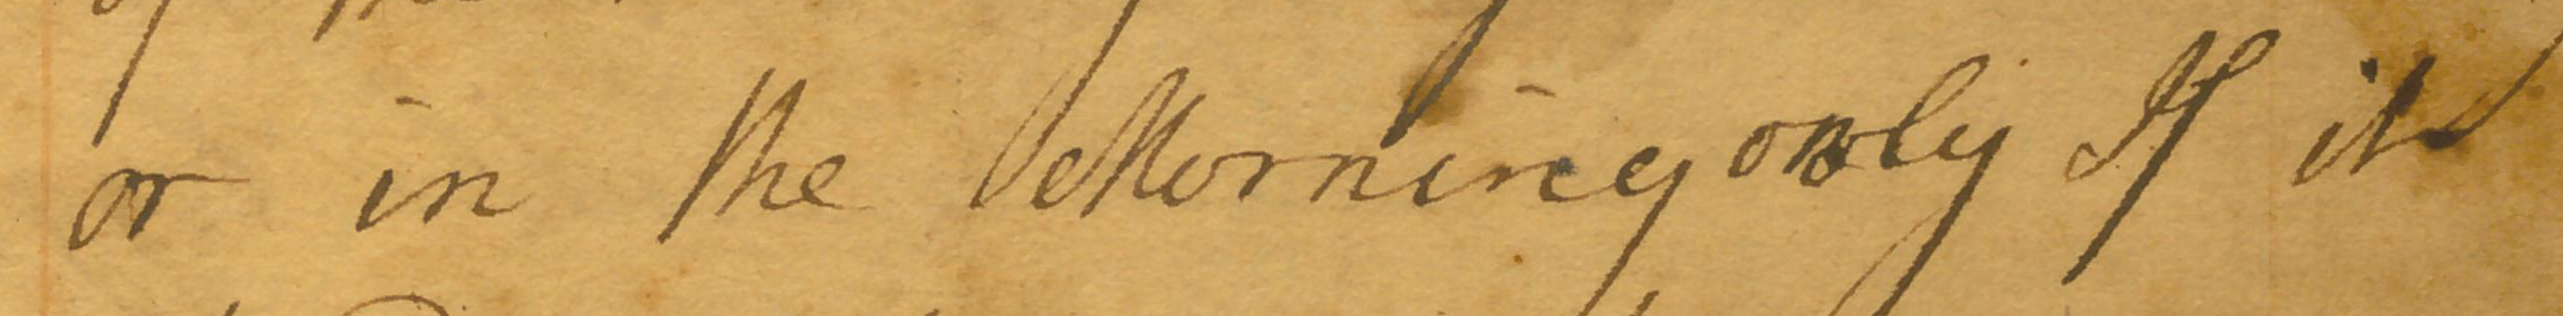or in the Morning only If it
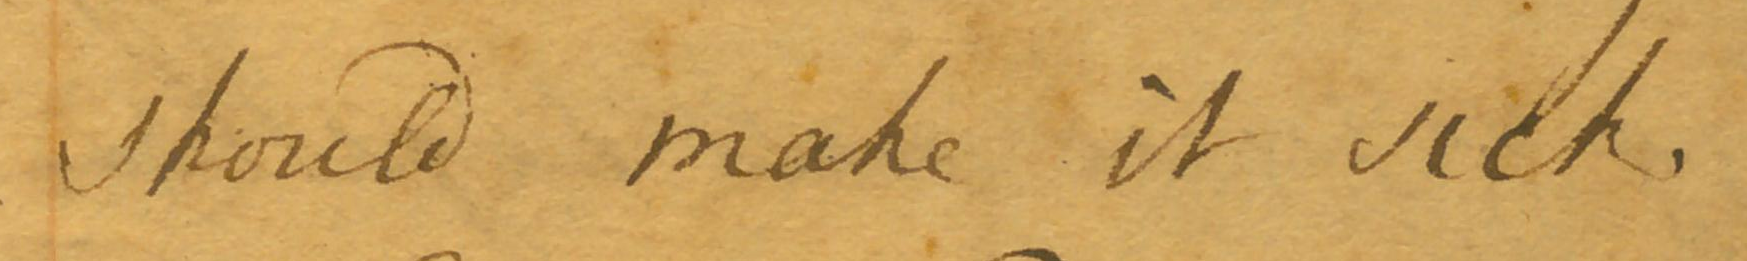should make it sick.
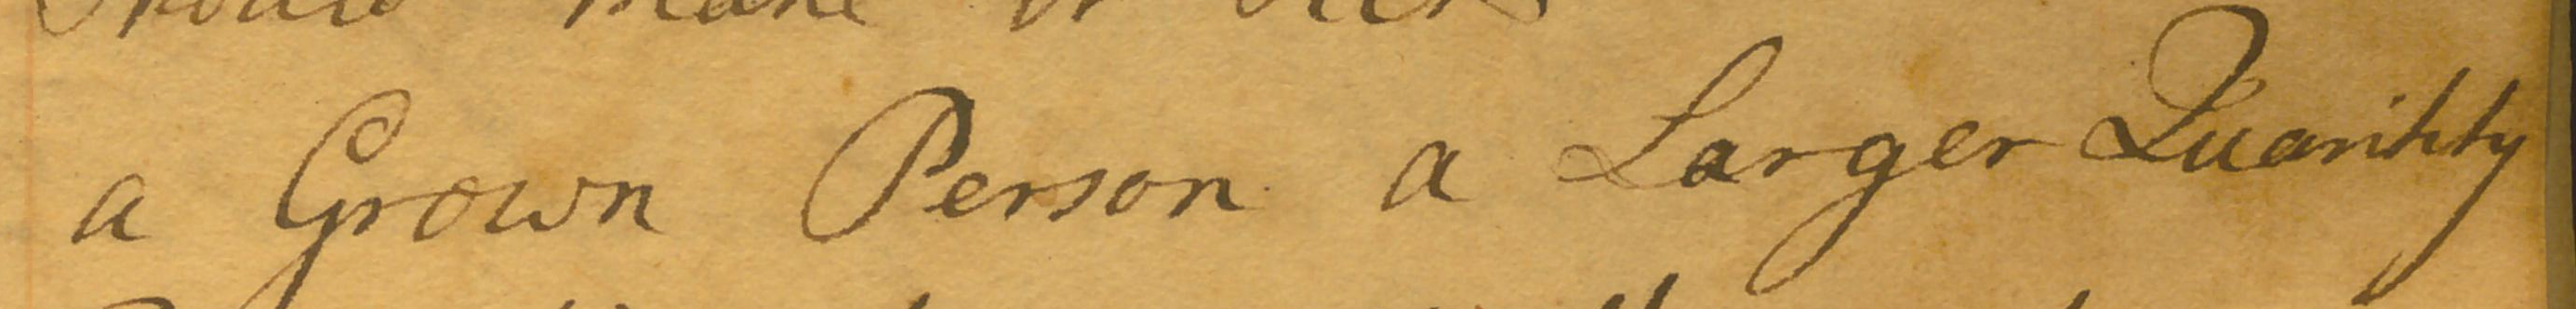a Grown Person a Larger Quantity
